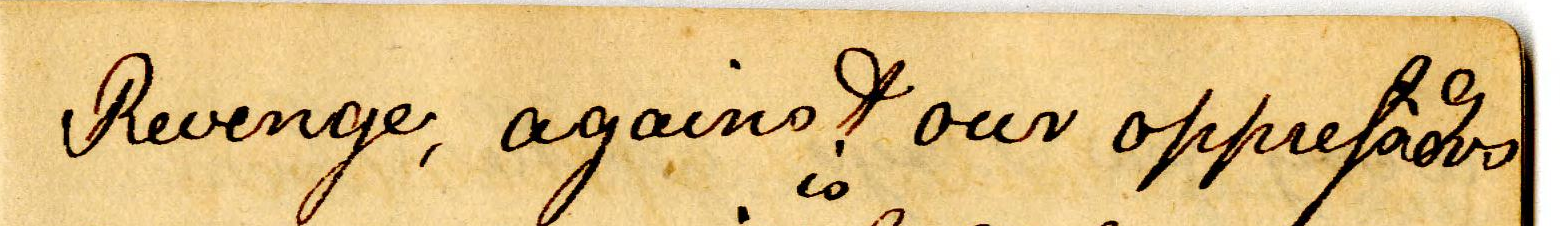Revenge against our oppressors
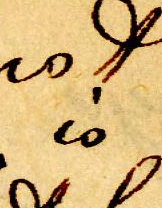is
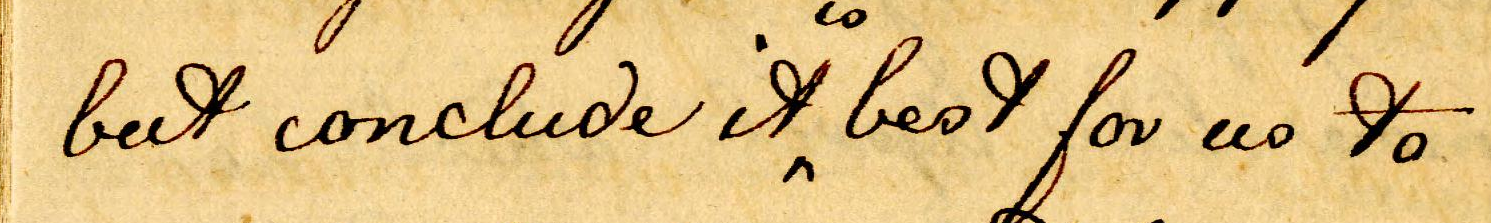but conclude it ^ best for us to
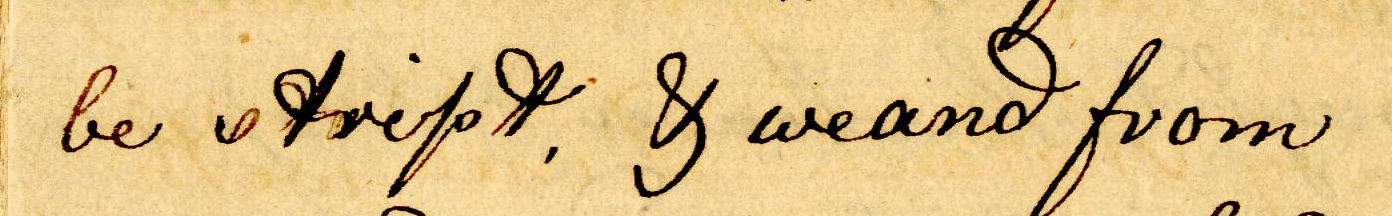be stript, & weand from
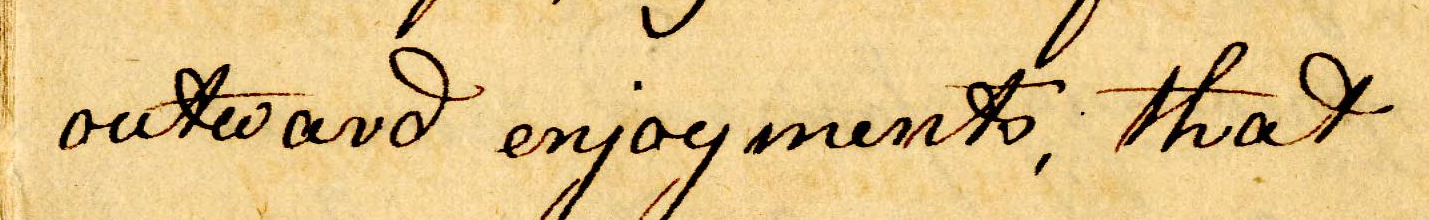outward enjoyments, that
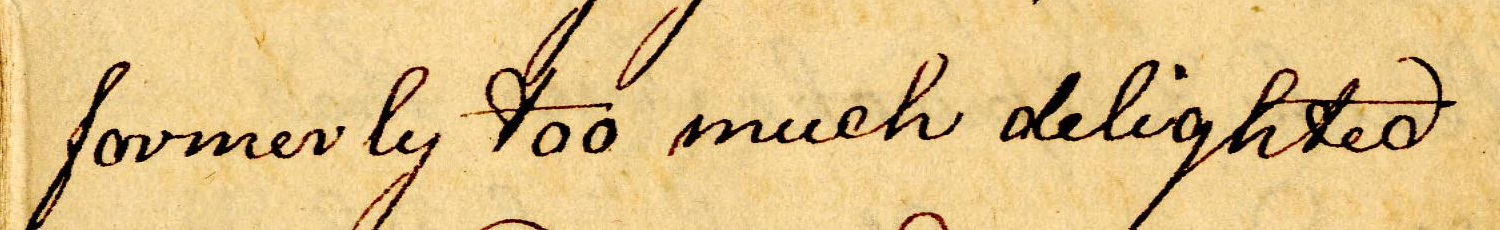formerly too much delighted
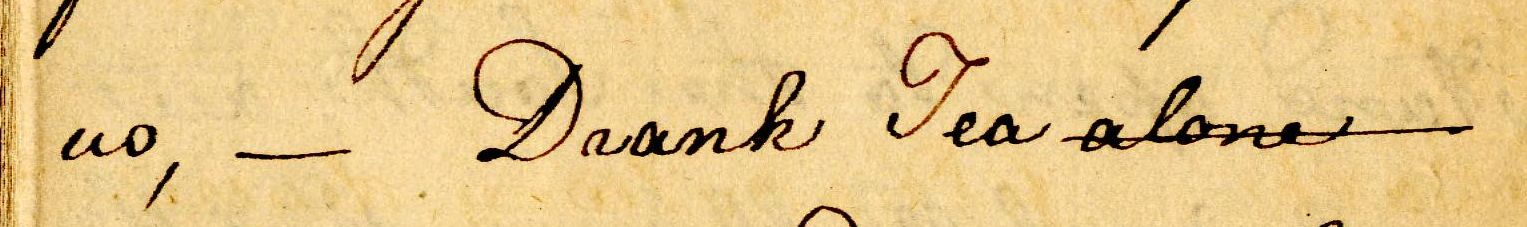us,- Drank Tea alone
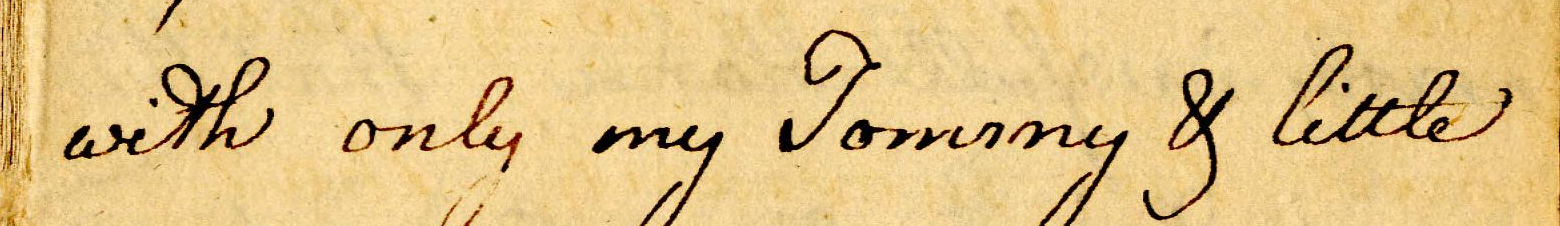with only my Tommy & little
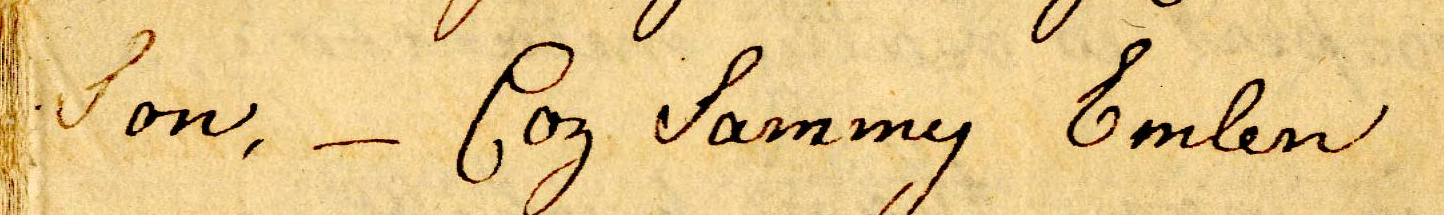Son,- Coz Sammy Emlen
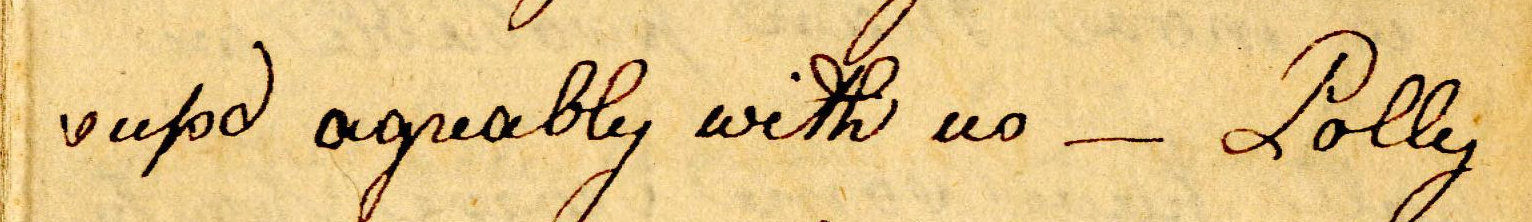supd agreably with us- Polly
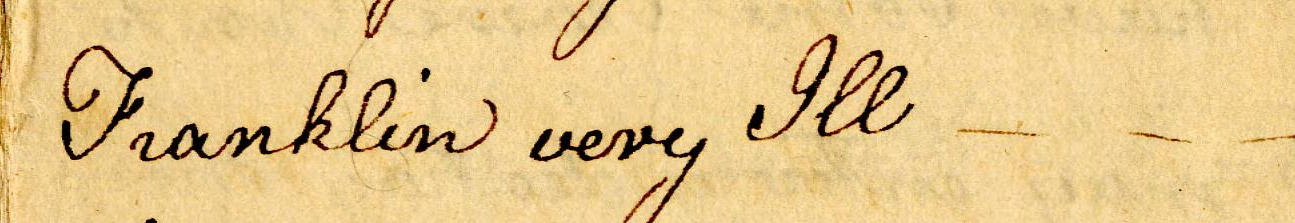Franklin very Ill
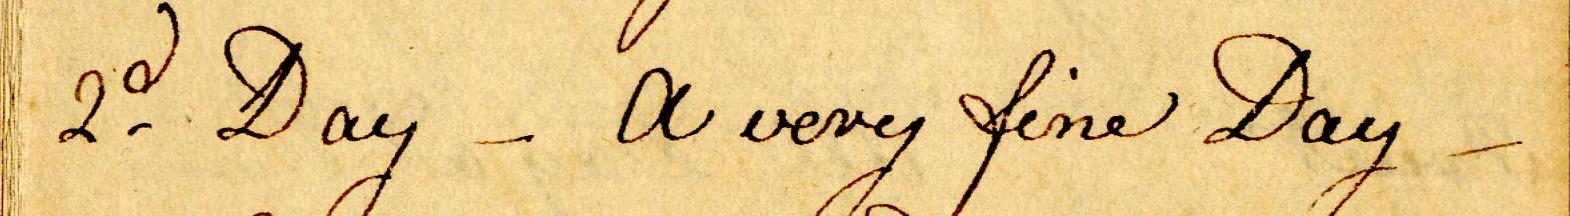2^d. Day- A very fine Day
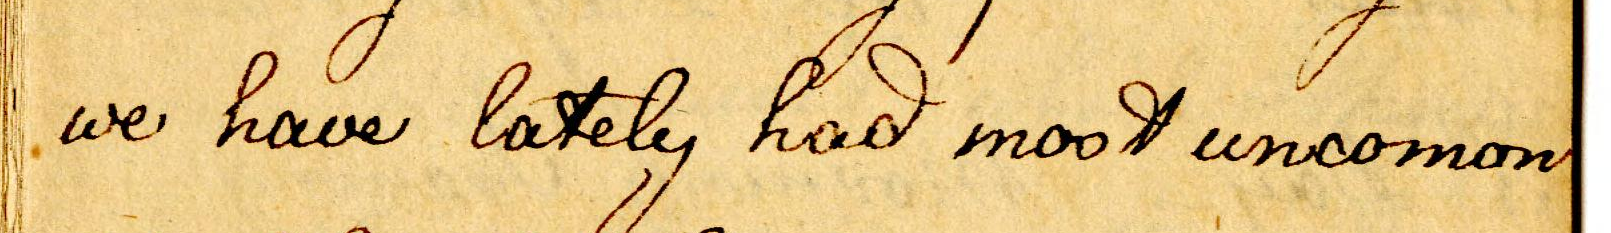we have lately had most uncomon
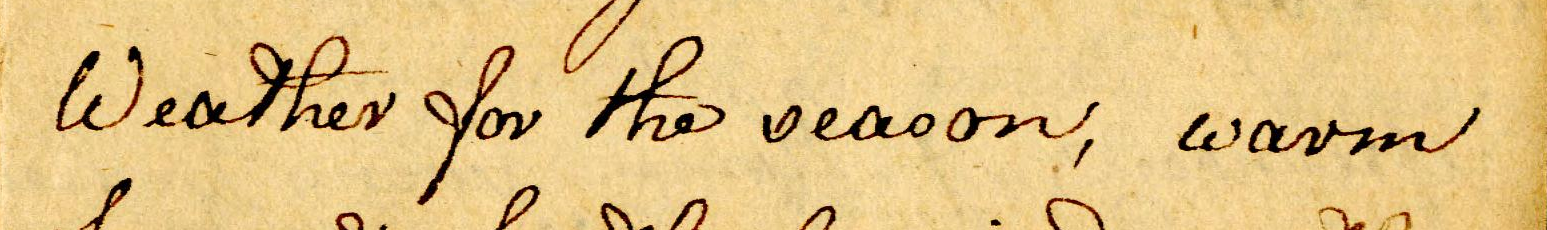Weather for the season, warm
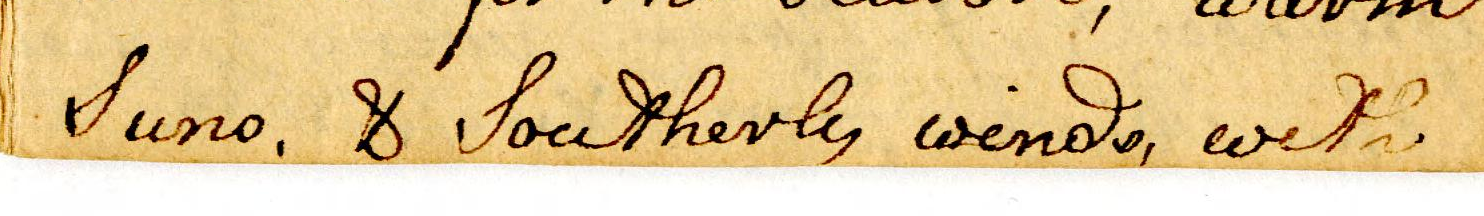Suns, & Southerly winds, with
